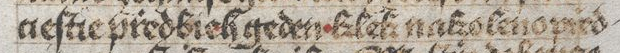cieſtíe. pṙedbieh geden klek na koleno pṙed
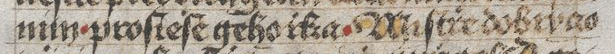ním. Proſíeẛe geho ṙka. Miſtṙe dobry co
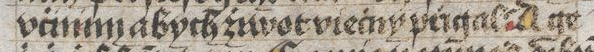vċinim abych żiwot vieċný pṙigal.A ge¬
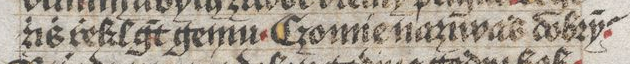żíṡ ṙekl ḡt gemu.Czo míe naziwaš dobrȳ?
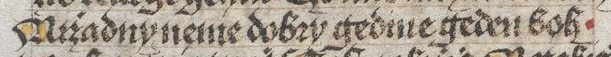Nizadny.neníe dobry gedine geden boh.
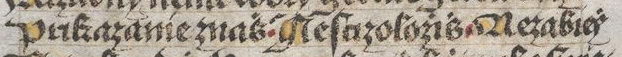Prikazanie znaš? Neſcizolażiṡ.Nezabieṡ
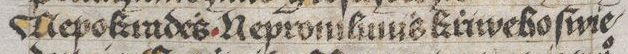Nepokradeṡ.Nepromluviṡ kṙiveko ſwie¬
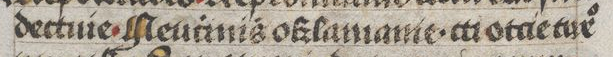dectuíe.Neuċiniṡ oklamaníe.cti otcie tweo
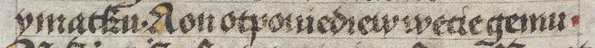y matku. A on otpouiediew wecie gemu.
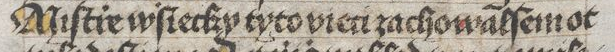MIſtṙe wẛiecky tyty vieci zachowal ſem ot
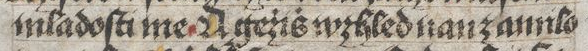mladoſti me.A geżiṡ wzhled nan zamilo¬
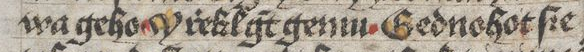wa geho.Y ṙekl ḡt gemu Gednohot ſie
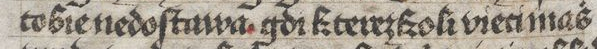tobie nedoſtawa gdi kterezkoli wieci maṡ¬
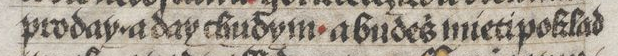proday.a day chudym.a budeṡ míeti poklad
